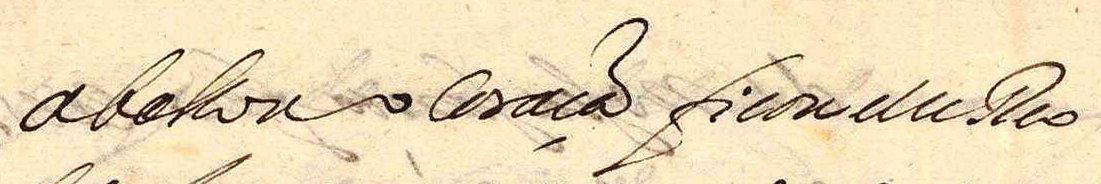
aballou o coraçaõ ficou elle Reo
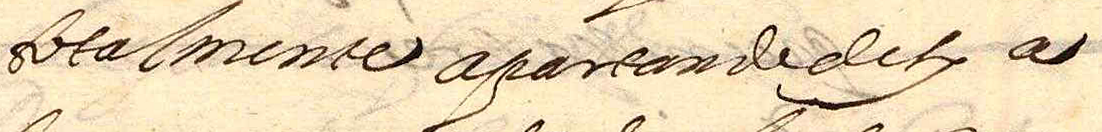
totalmente apartando de sy a
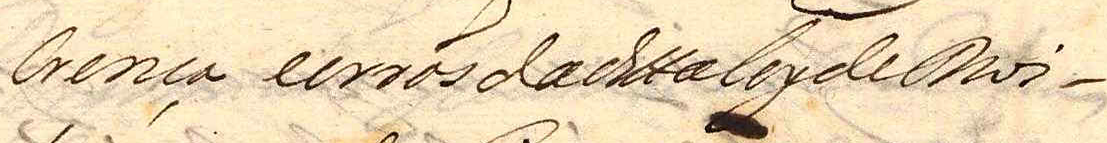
crença e erros da ditta ley de Moi
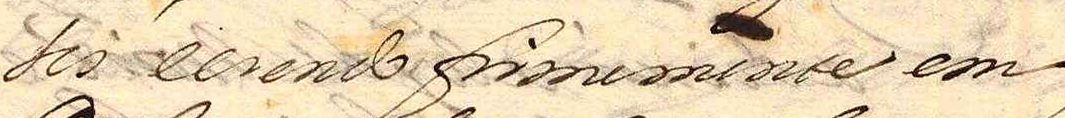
ses, e crendo firmemente em
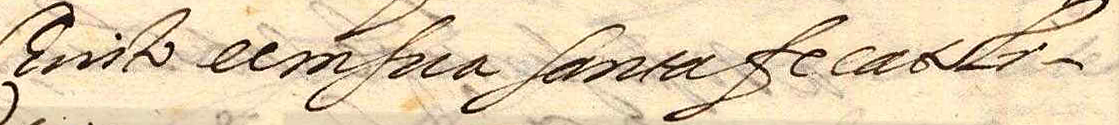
Christo e em sua santa fe catoli
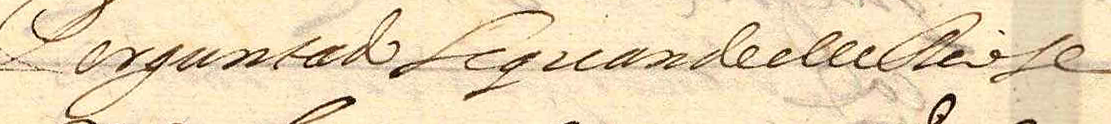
Perguntado se quando elle Reo se
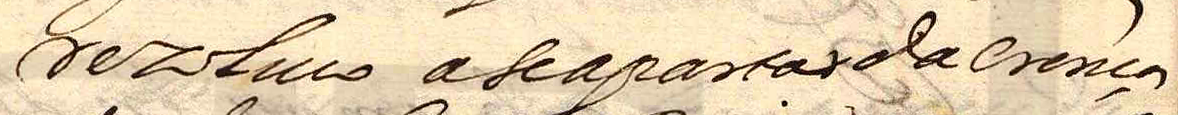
rezolueo a se apartar da crença
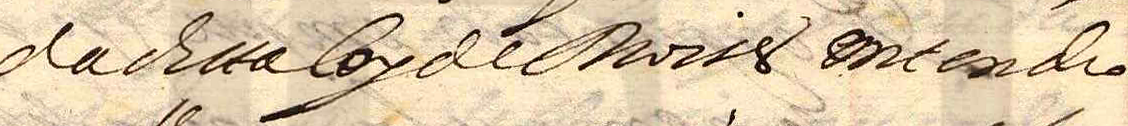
da ditta ley de Moises entendeo
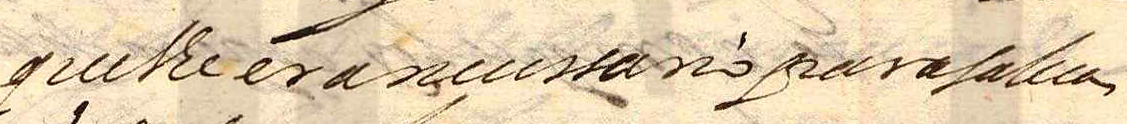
que lhe era necessario para salua
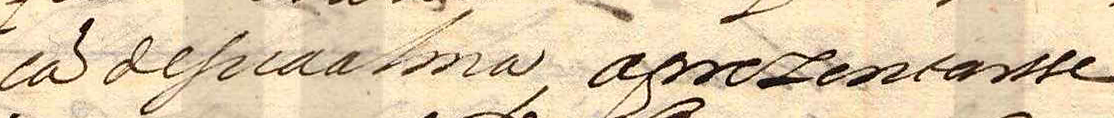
çaõ de sua alma aprezentarse
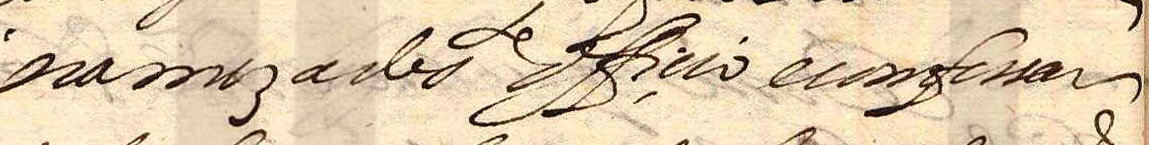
na meza do sto officio e confessar
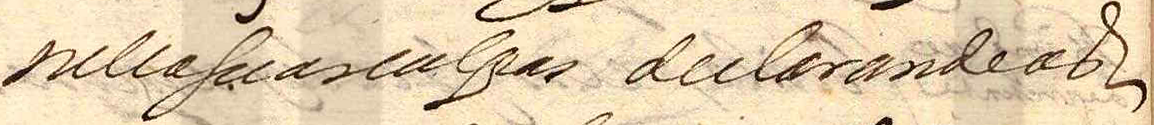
nella suas culpas declarando as
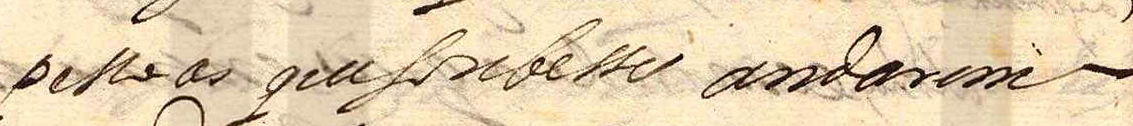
pessoas que soubesse andarem
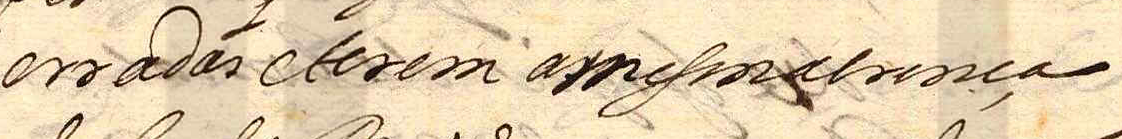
erradas e terem a mesma crença
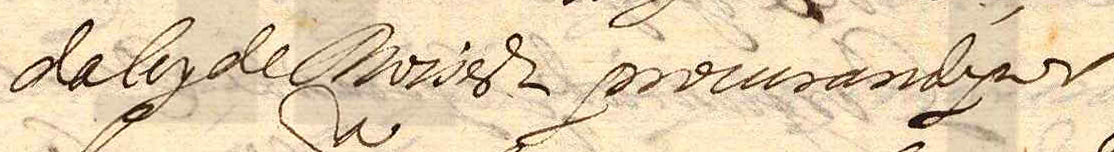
da ley de Moises procurando por
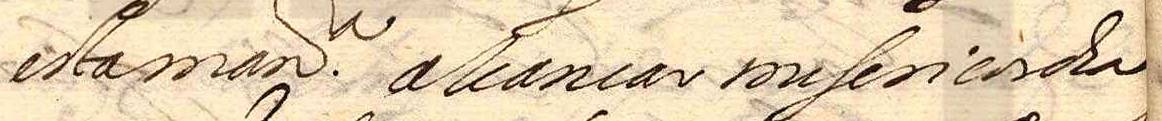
esta man.ra alcançar misericordia
